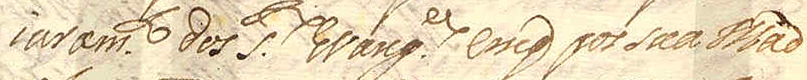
iuram.to dos s.tos Evang.os em q̄ pos sua Mão
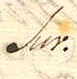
Iur.
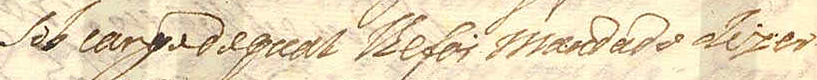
sob cargo do qual lhe foi mandado dizer
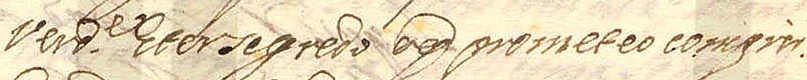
Verd.e E ter segredo o q̄ prometeo comprir.
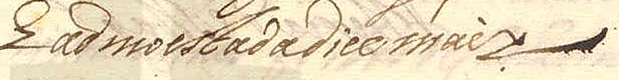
E admoestada dice maiz
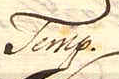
Temp.
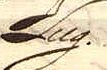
Lug.
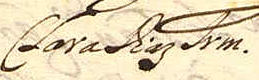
Clara Diaz Irm.
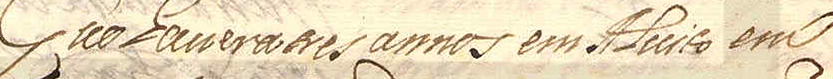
Que hauera tres annos em Aluito em
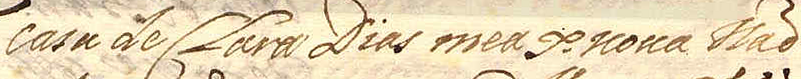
casa de Clara Dias mea x. noua naõ
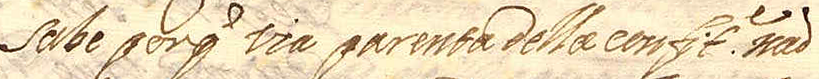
sabe por q̄ via parenta della confit.e naõ
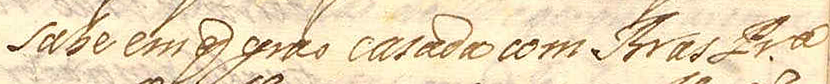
sabe em q̄ grao casada com Bras Pr.a
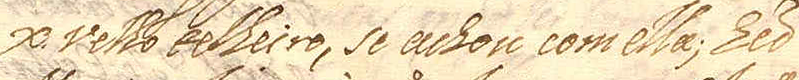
x. velho telheiro, se achou com ella; E cō
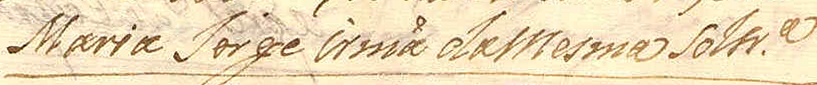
Maria Iorge irmã da mesma soltr.a
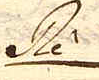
Rê
